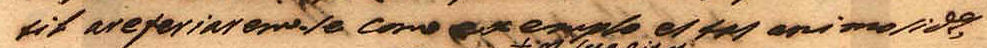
til a referiarem-se como exemplo estas animosid.es,
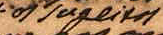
os sugeitos
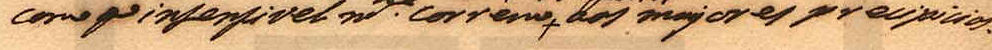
como q̄ insensivelm.te correm dos majores precipicios.
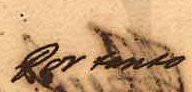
Portanto
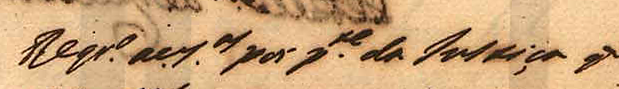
Reqr.o a v.s.as por p.te da Iustiça q̄
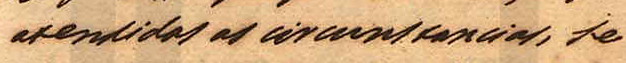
atendidas as circunstancias, se
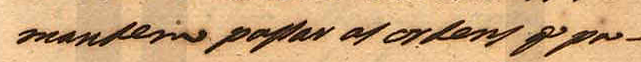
mandem passar as ordens q̄ pa
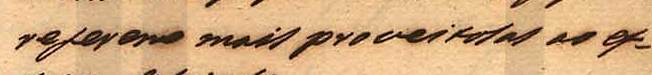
reserem mais proveitosas ao ef
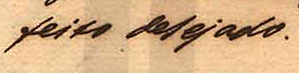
feito desejado.
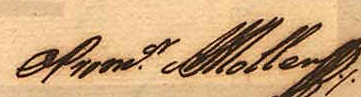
O Prom.or Moller
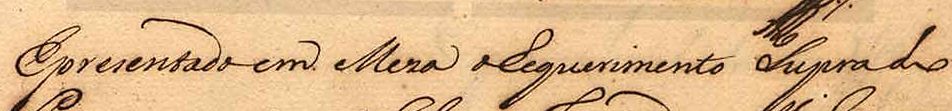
E presentado em Meza o Requerimento Supra do
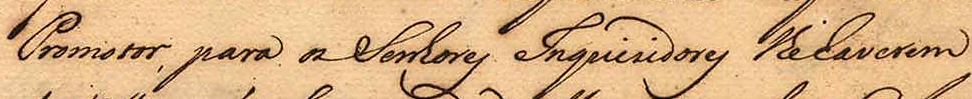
Promotor, para os Senhores Inquizidores lhe haverem
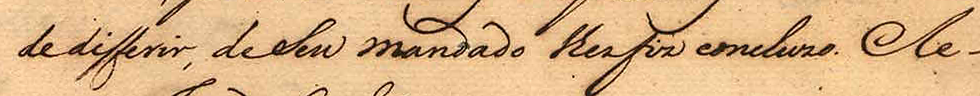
de differir, de Seu mandado lhes fiz concluzo. Cle
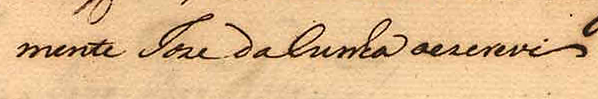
mente Ioze da Cunha o escrevi
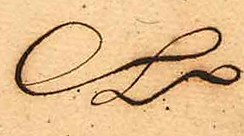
CL.o
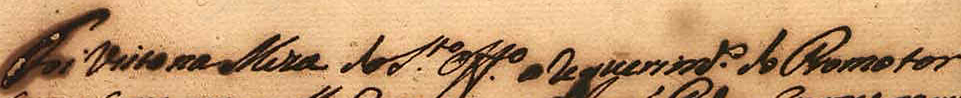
Foi visto na Meza do S.to Off.o o Requerim.to do Promotor
